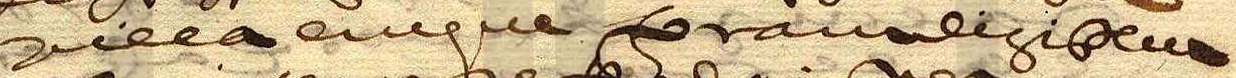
villa em que foram dizistem
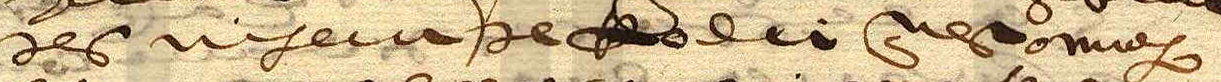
tes uisemte Rodrigues o moso
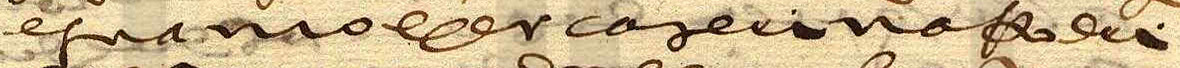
e sua molher caterina Rodri
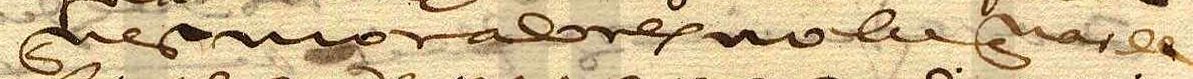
gues moradores no luguar de
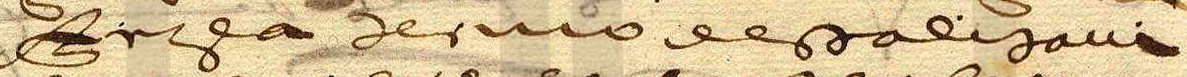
Arzea termo desta dita ui
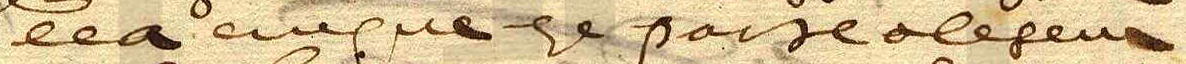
lla em que he parte o lesem
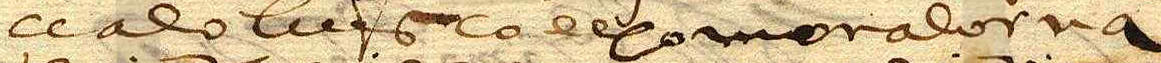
ceado luis coelho morador na
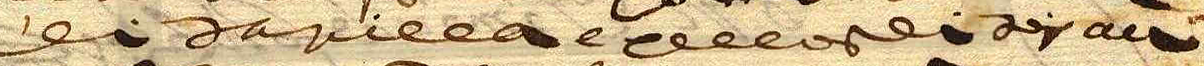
dita villa e pellos ditos au
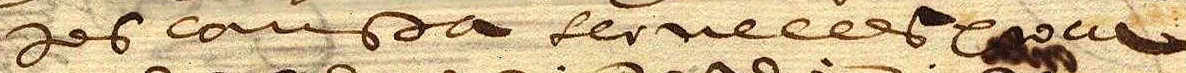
tos consta ser nelles procu
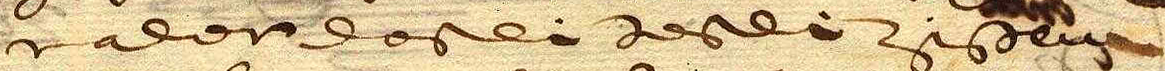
rador dos ditos dizistem
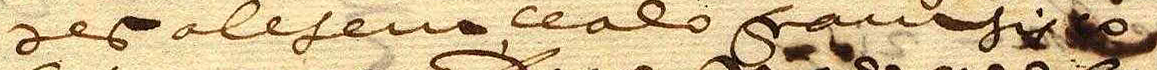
tes o lesemceado framsisco
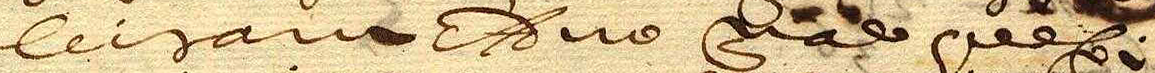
leitam Aduoguado que foi
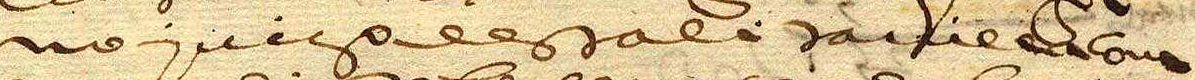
no juizo desta dita uilla com
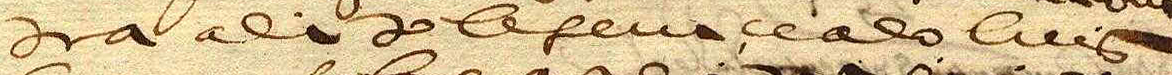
tra o dito lesemceado luis
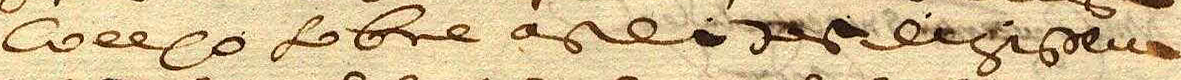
Coelho sobre os ditos dizistem
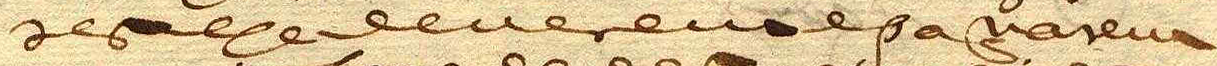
tes lhe deuerem e paguarem
